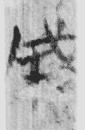成
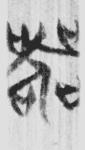器
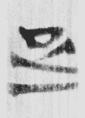疋
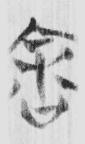{余口}
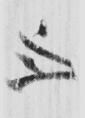之
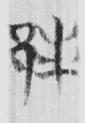邦
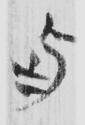此
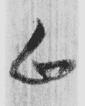㠯（以）
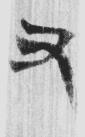又
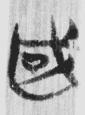或
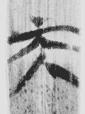天
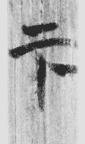下
